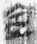金
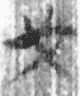戈
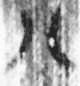八
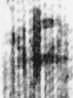才（在）
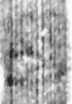○{匚去}
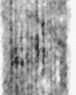{阝咸}
